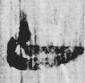㠯（以）
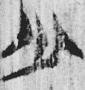少（宵）
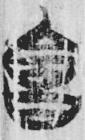會
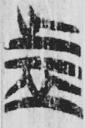者（諸）
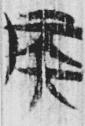侯
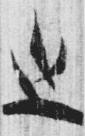之
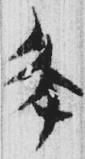帀（師）
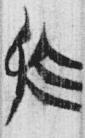於
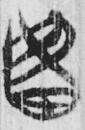○（牧）
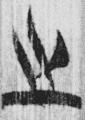之
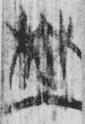埜（野）
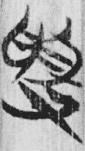受（紂）
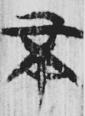不
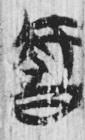智（知）
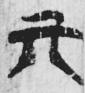亓（其）
